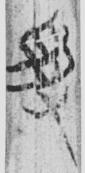受
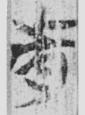前（延）
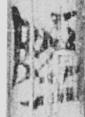陵
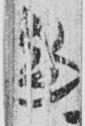子季
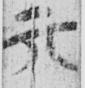亓（其）
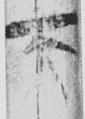天
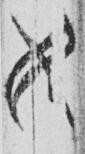民
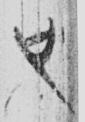也
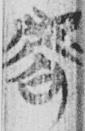○（乎）
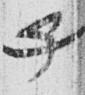子
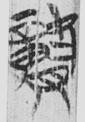贛（貢）
